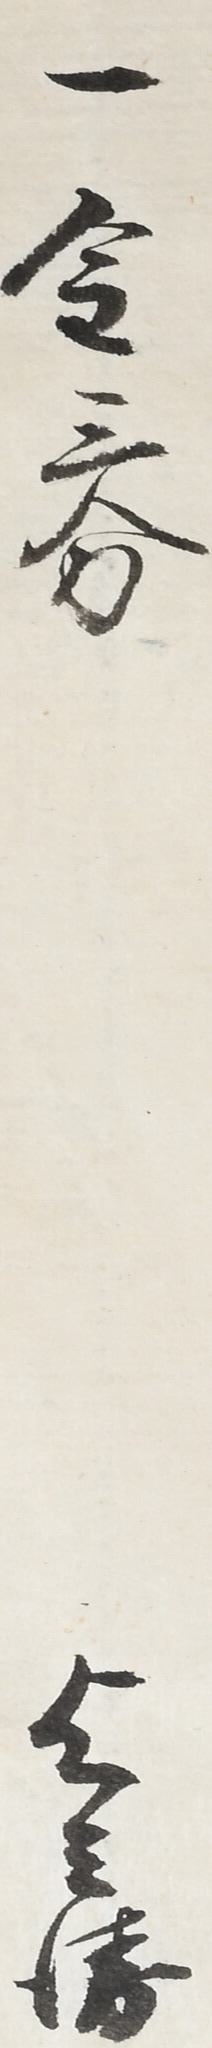一金三分与兵衛
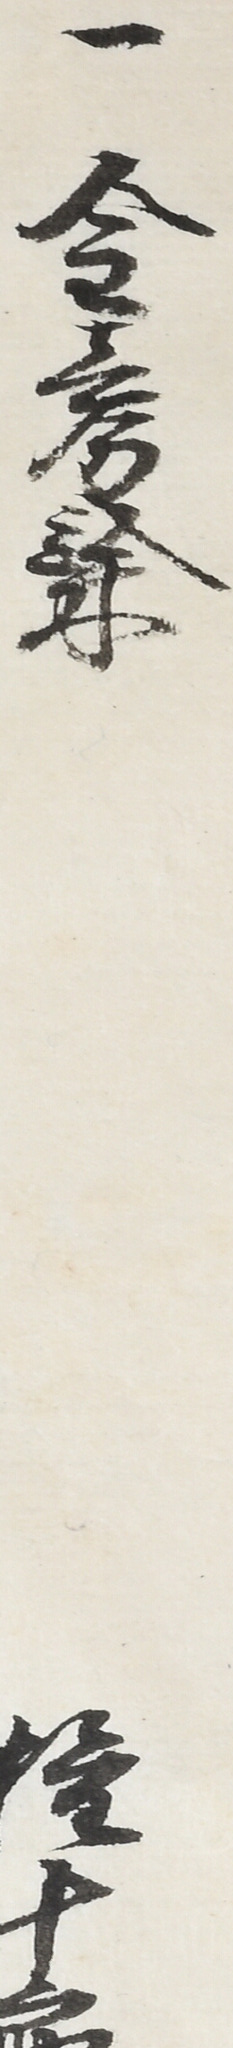一金壱分弐朱権十郎

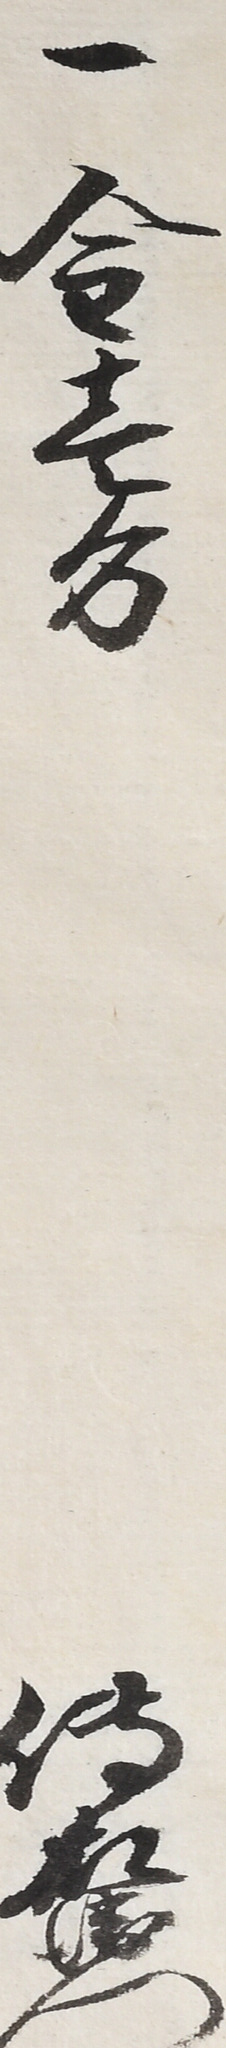一金壱分伝左衛門
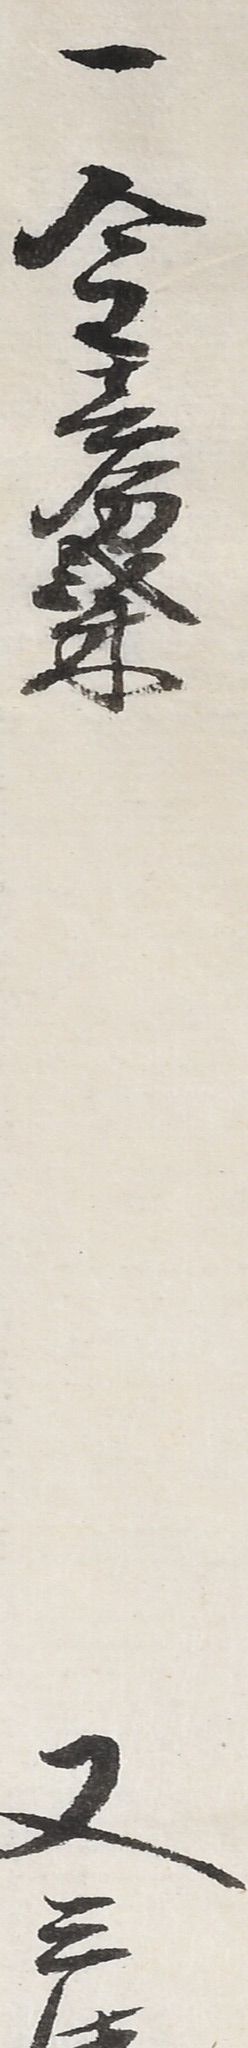一金壱分弐朱又兵衛
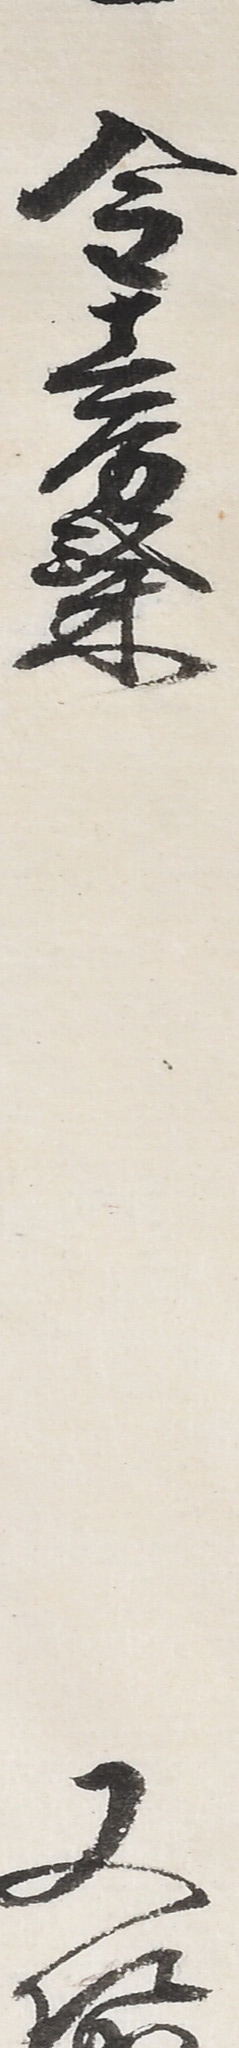一金壱分弐朱又兵衛
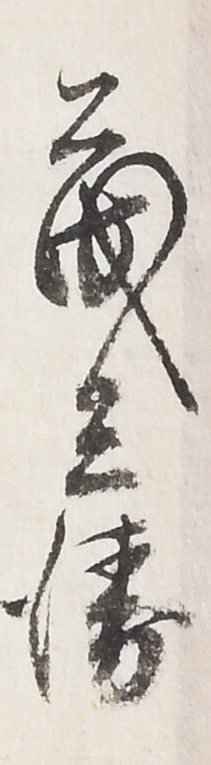新兵衛
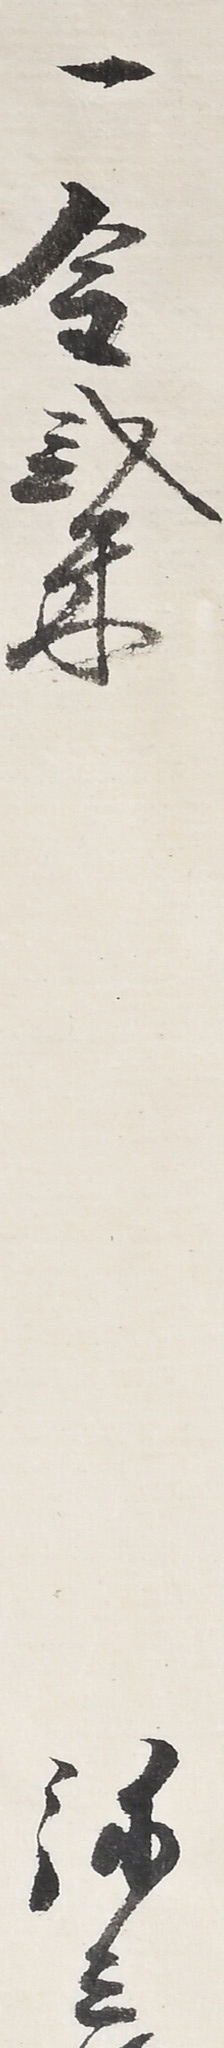一金弐朱弥兵衛
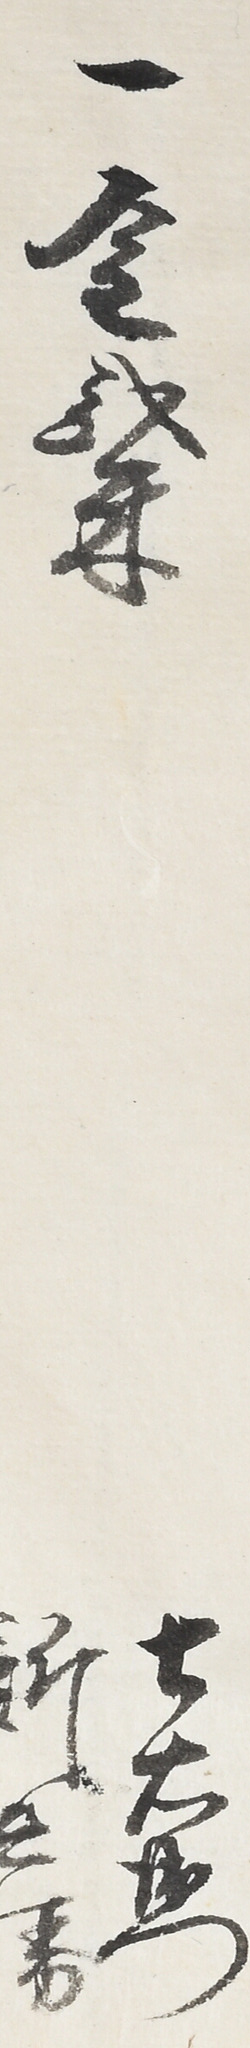一金弐朱七右衛門
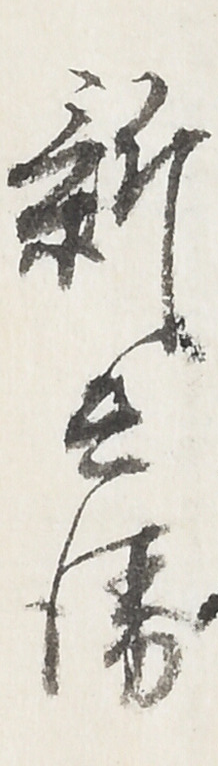新兵衛

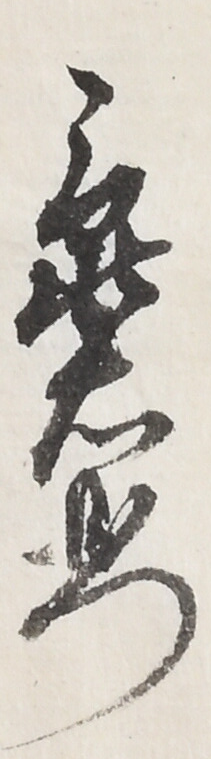角右衛門
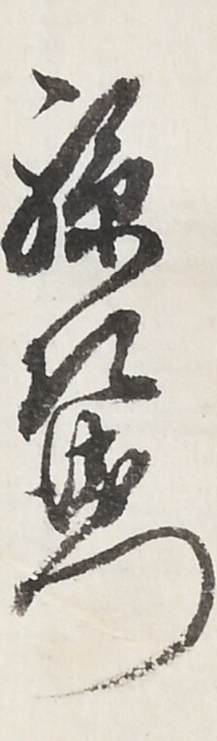角右衛門
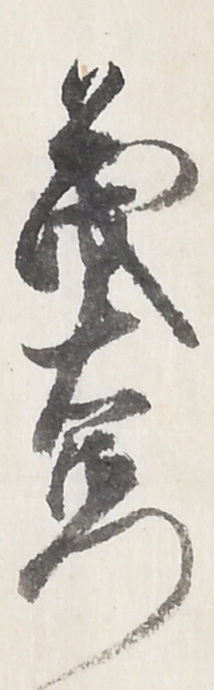角右衛門
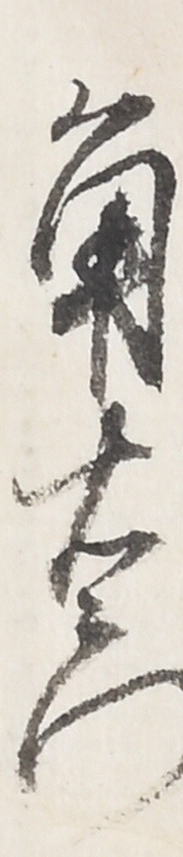角右衛門
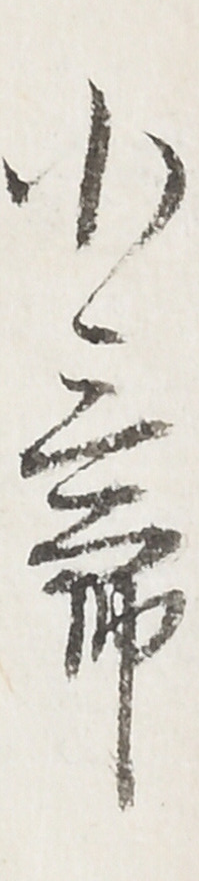小三郎
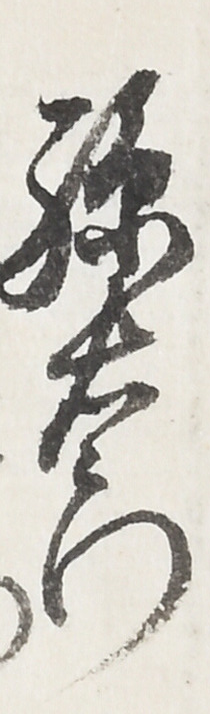角右衛門
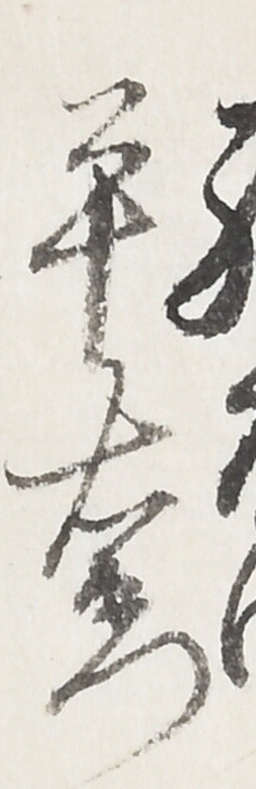平右衛門
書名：御拝地百五拾年御祝儀献上御目録名前
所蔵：伊那市立高遠町図書館・合同会社AMANE
